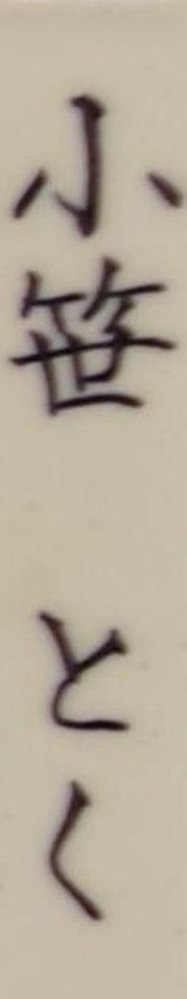小笹とく
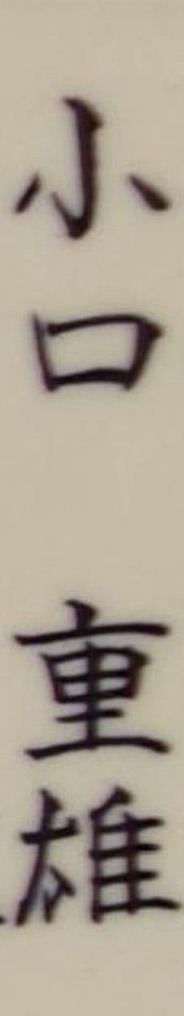小口重雄
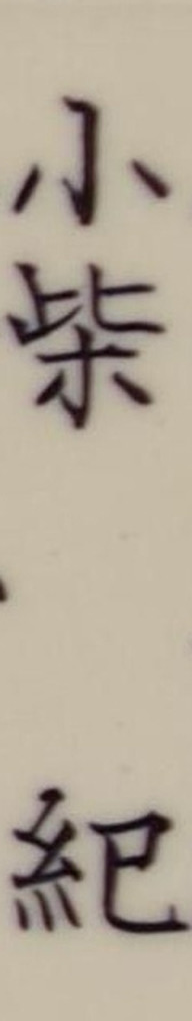小柴紀
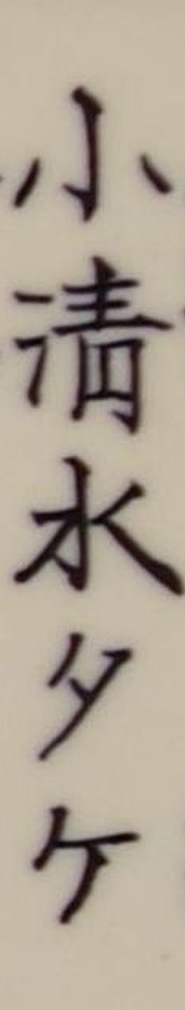小清水タケ
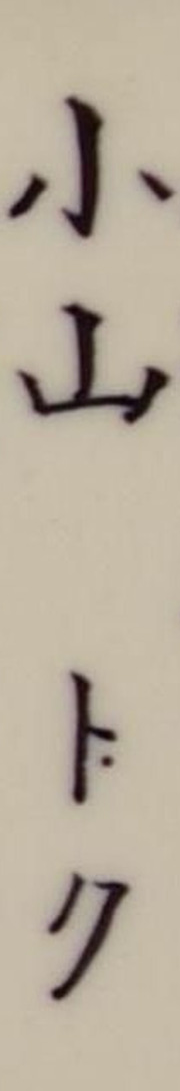小山トク
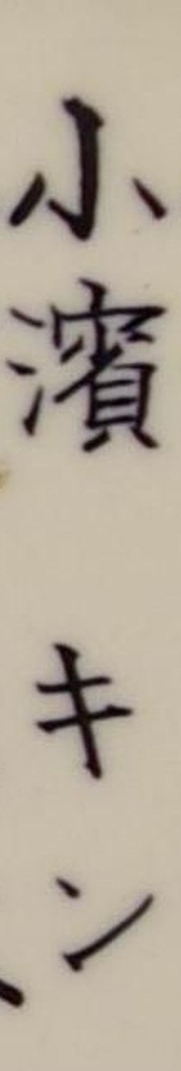小濱キン
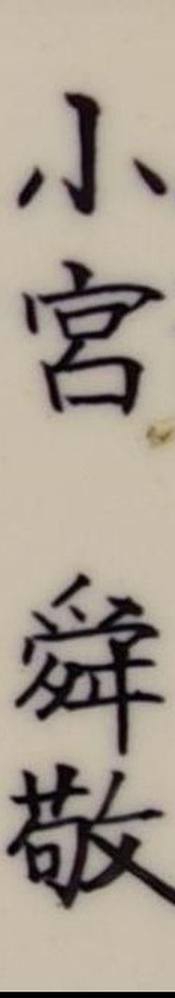小宮舜敬
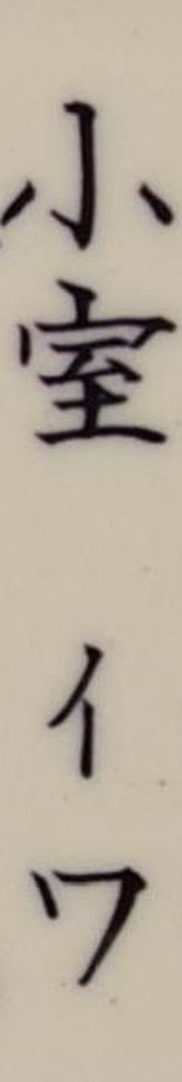小室イワ
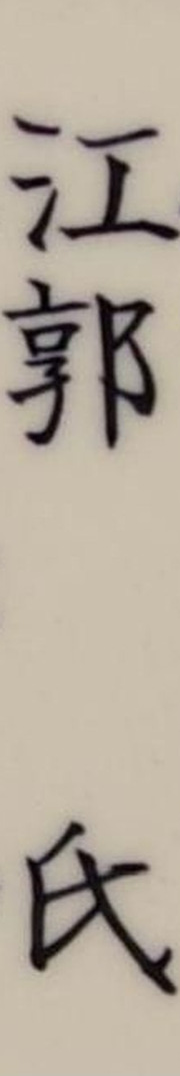江郭氏
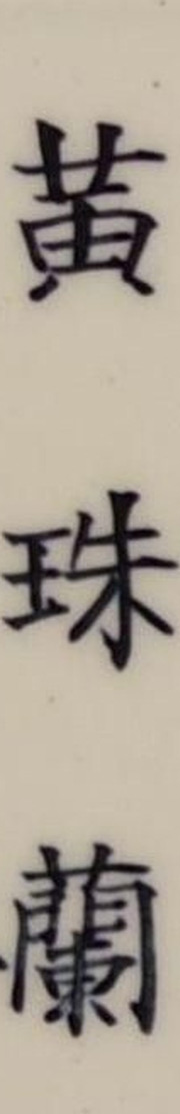黄珠蘭
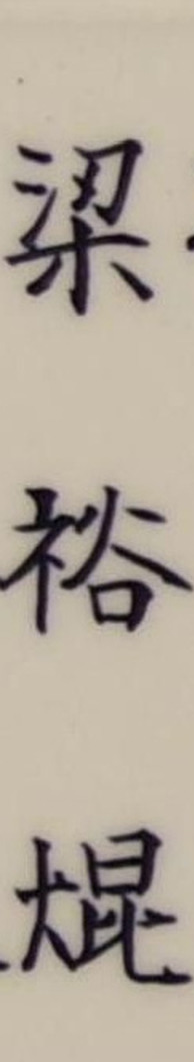梁裕焜
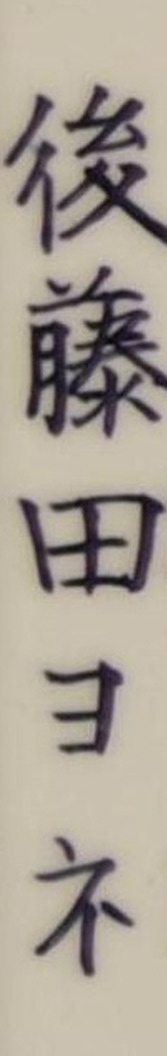後藤田ヨネ

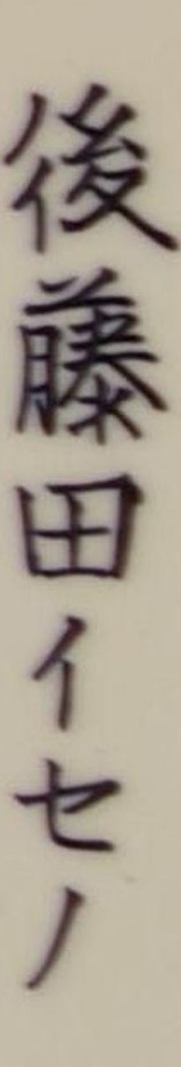後藤田イセノ
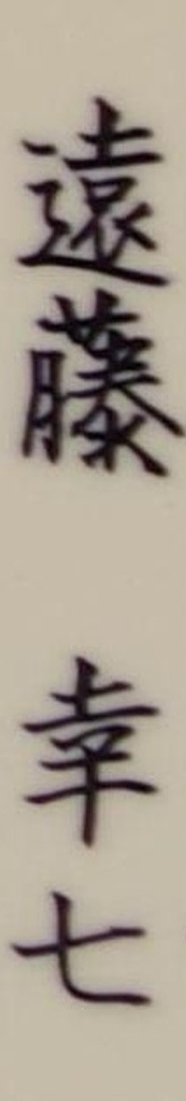遠藤幸七
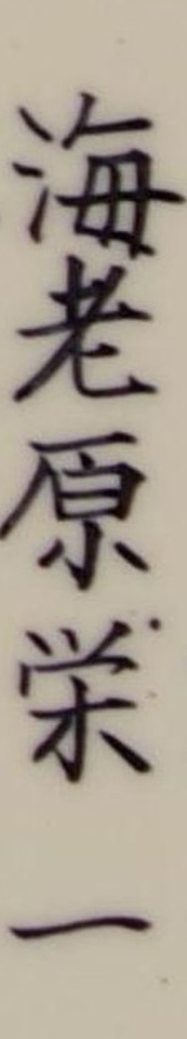海老原栄一
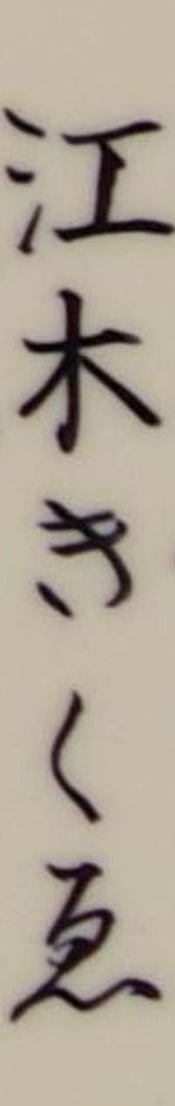江木きくえ
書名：E~L
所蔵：高野山金剛峯寺
